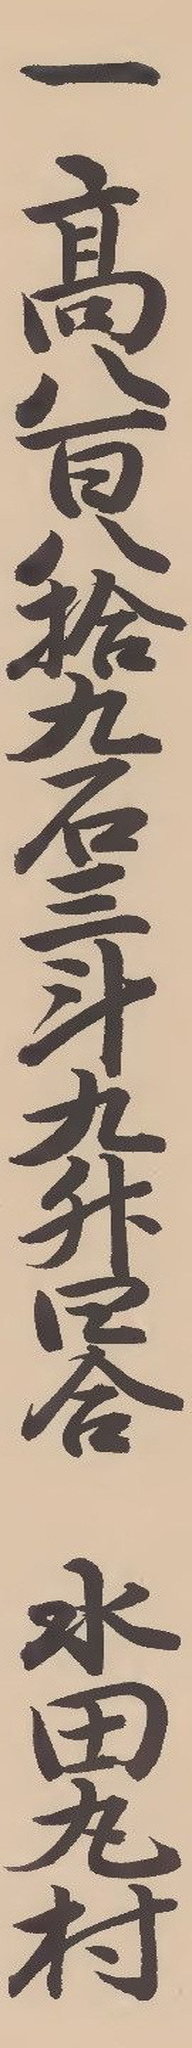一高八百八拾九石三斗九升四合水田丸村
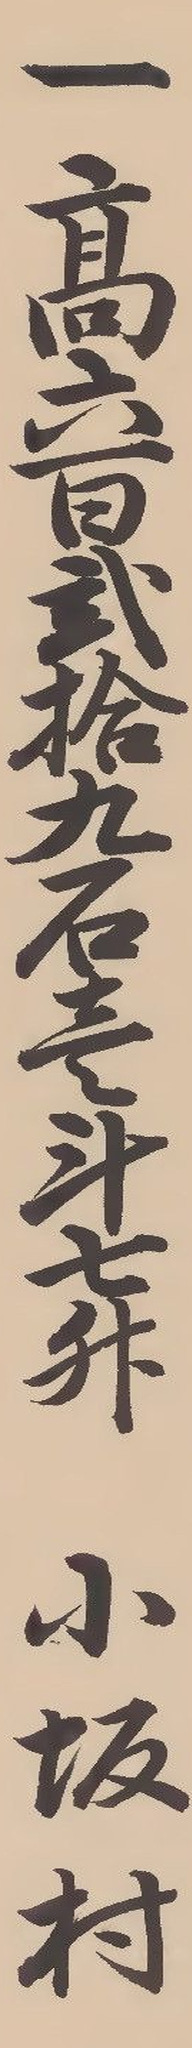一高六百弐拾九石壱斗七升小坂村
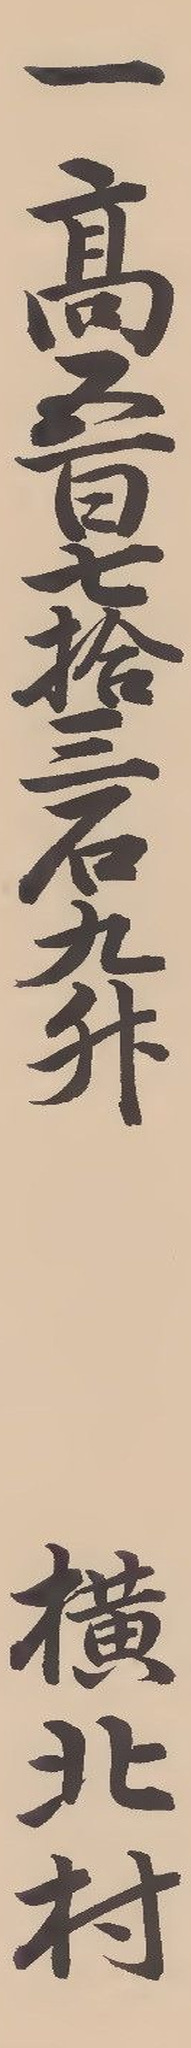一高五百七拾三石九升横北村
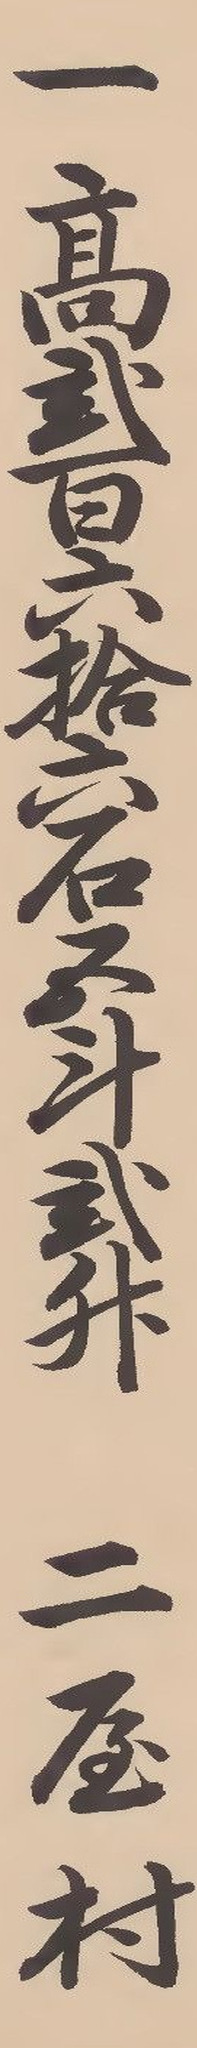一高弐百六拾六石五斗弐升二屋村
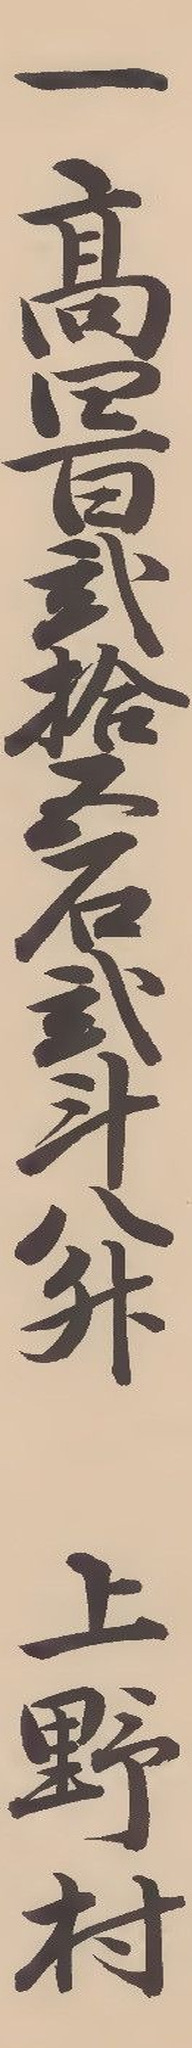一高四百弐拾五石弐斗八升上野村
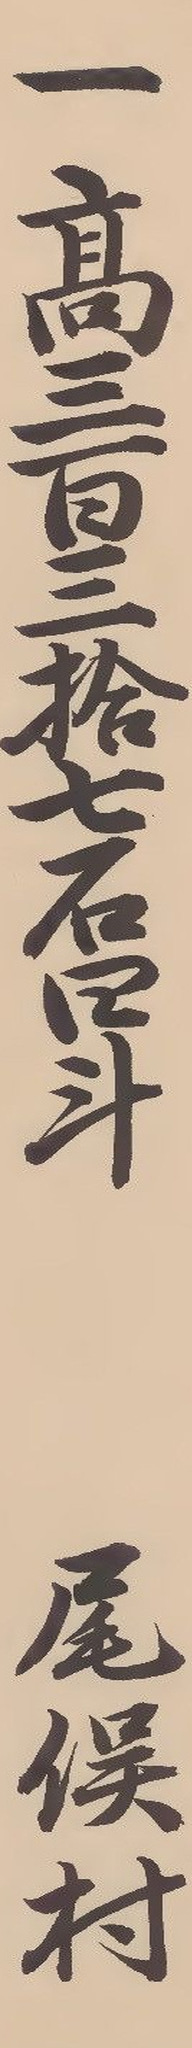一高三百三拾七石四斗尾俣村
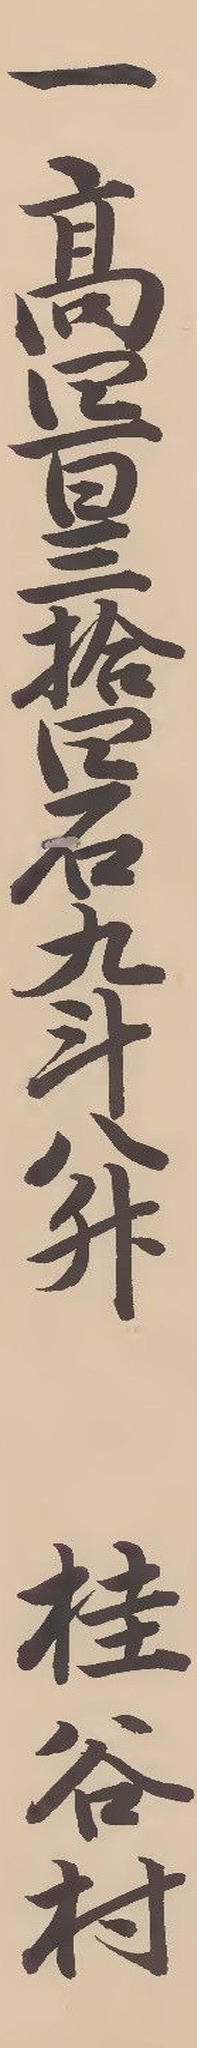一高四百三拾四石九斗八升桂谷村

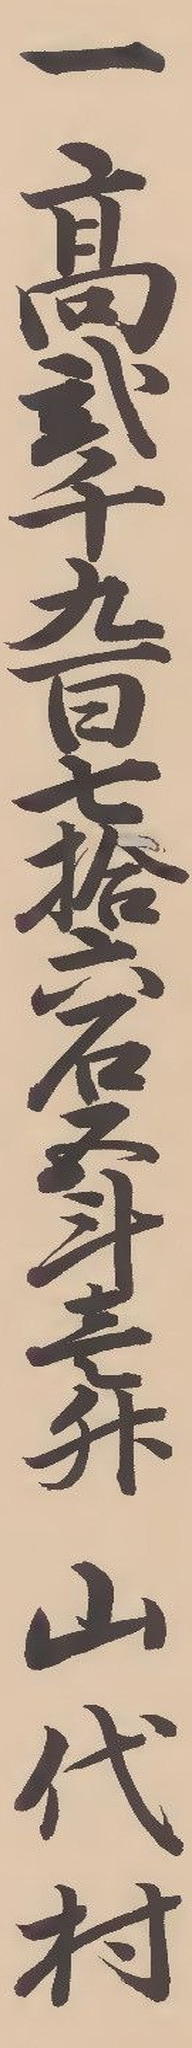一高弐千九百七拾六石五斗壱升山代村
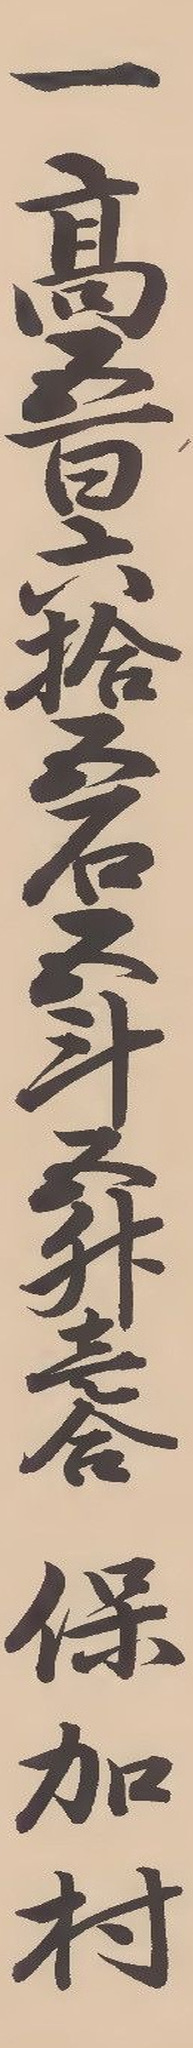一高五百六拾五石五斗五升壱合保加村
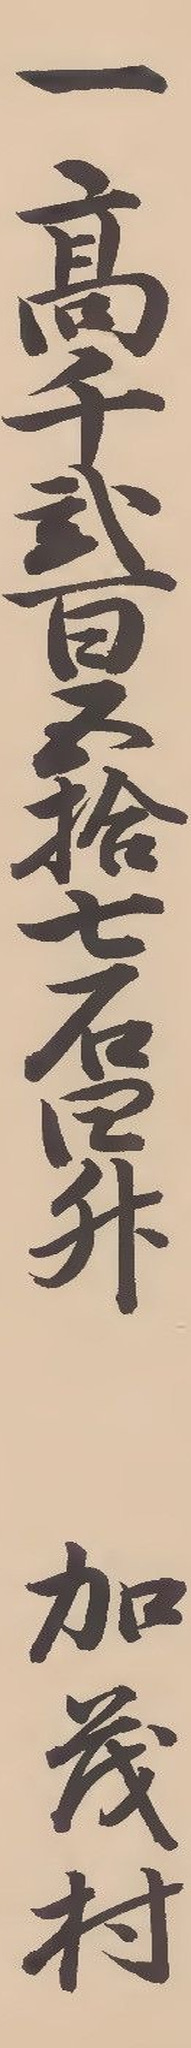一高千弐百五拾七石四升加茂村
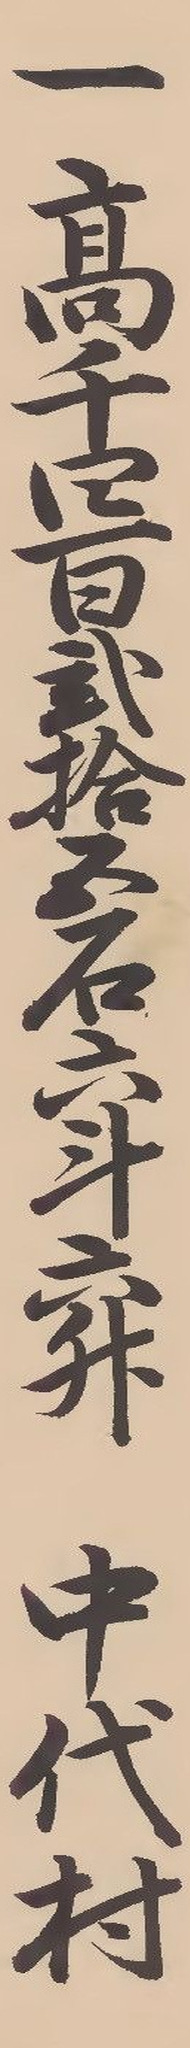一高千四百弐拾五石六斗六升中代村
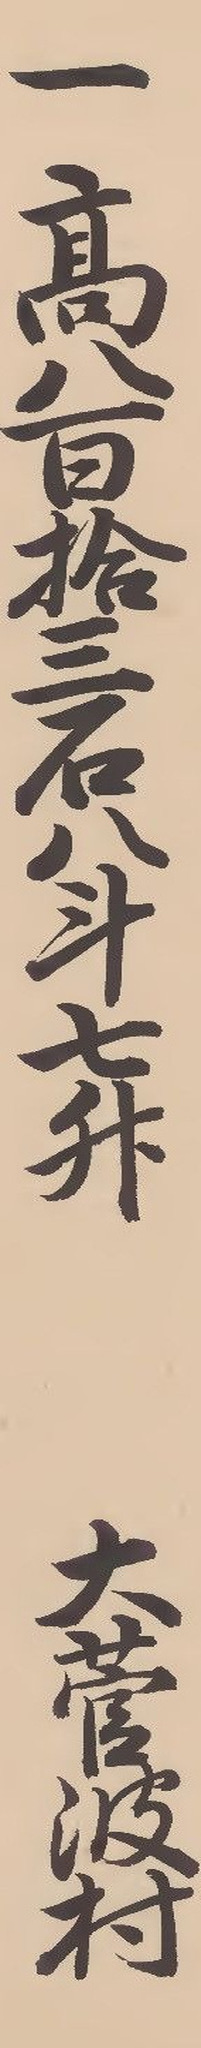一高八百拾三石八斗七升大菅波村
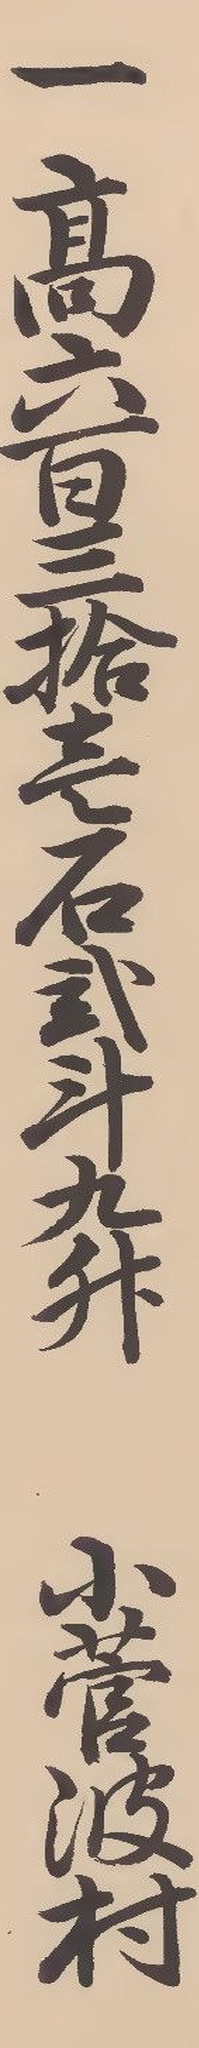一高六百三拾壱石弐斗九升小菅波村
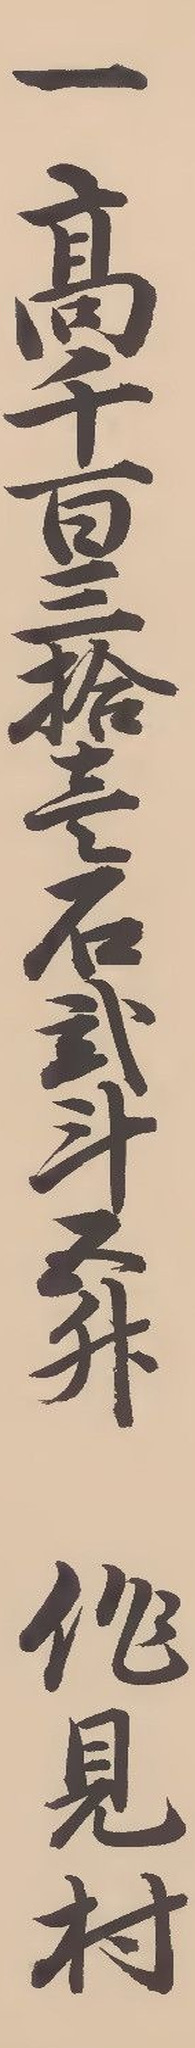一高千百三拾壱石弐斗五升作見村
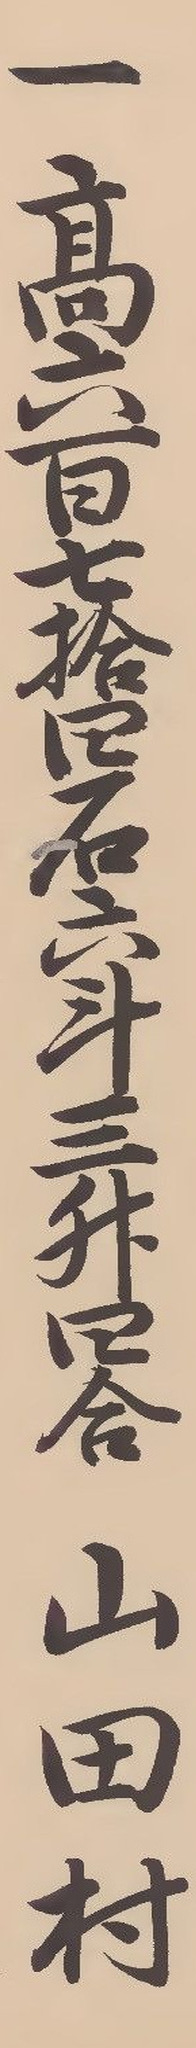一高六百七拾四石六斗三升四合山田村

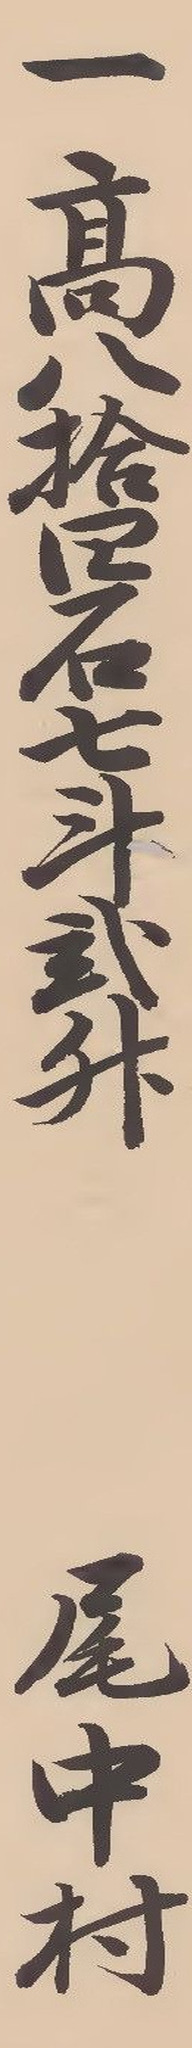一高八拾四石七斗弐升尾中村
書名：加賀国郷帳
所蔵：国立公文書館 National Archives of Japan
